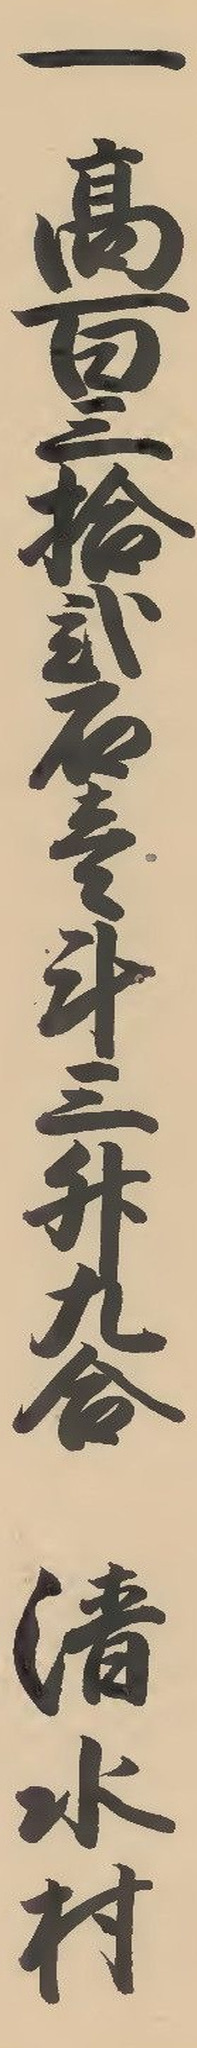一高百三拾弐石壱斗三升九合清水村
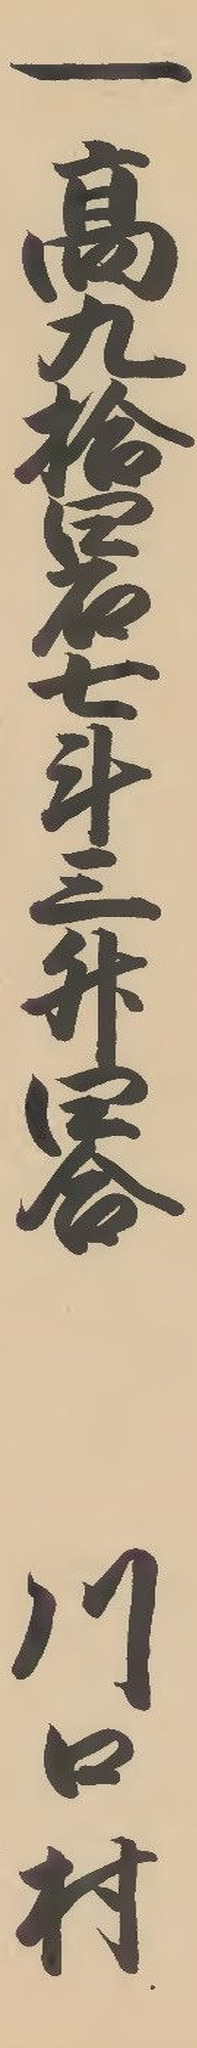一高九拾四石七斗三升四合川口村
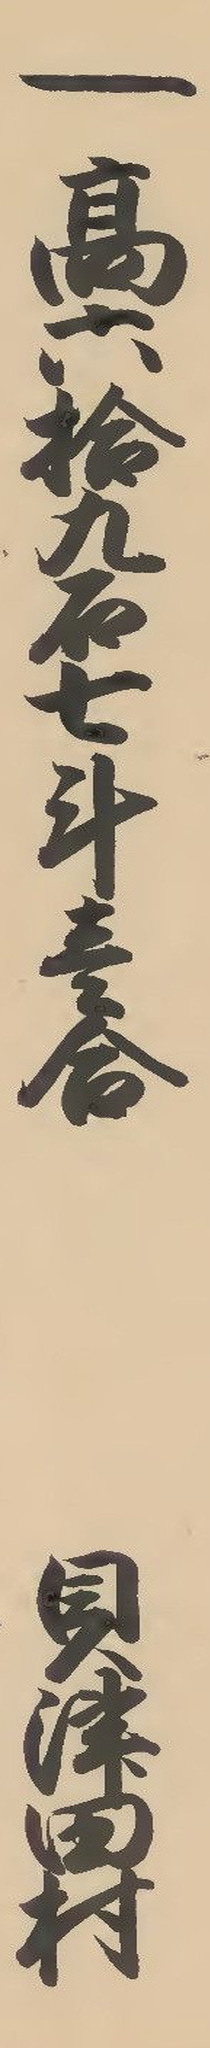一高六拾九石七斗壱合貝津田村
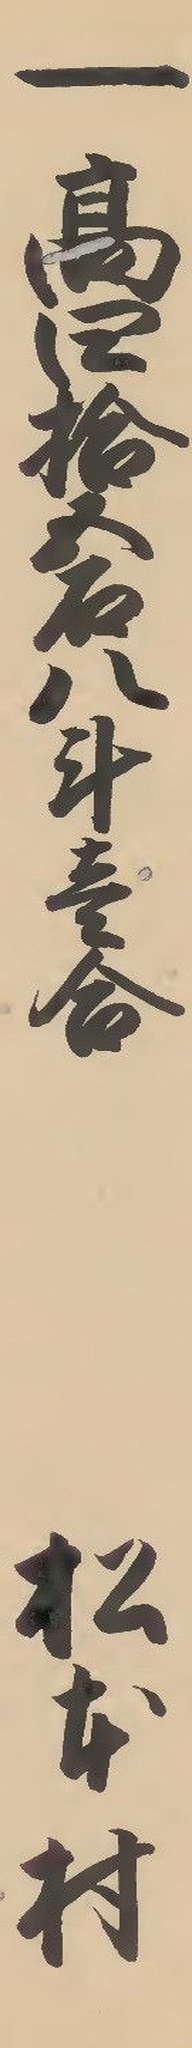一高四拾五石八斗壱合松本村
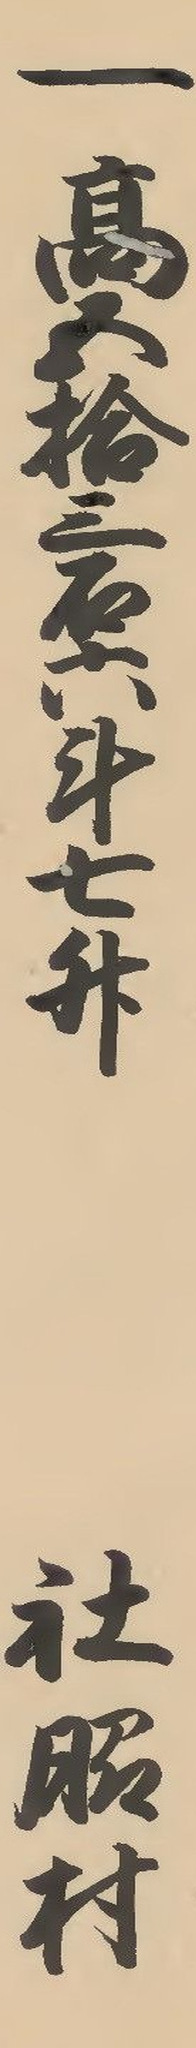一高五拾三石六斗七升社脇村
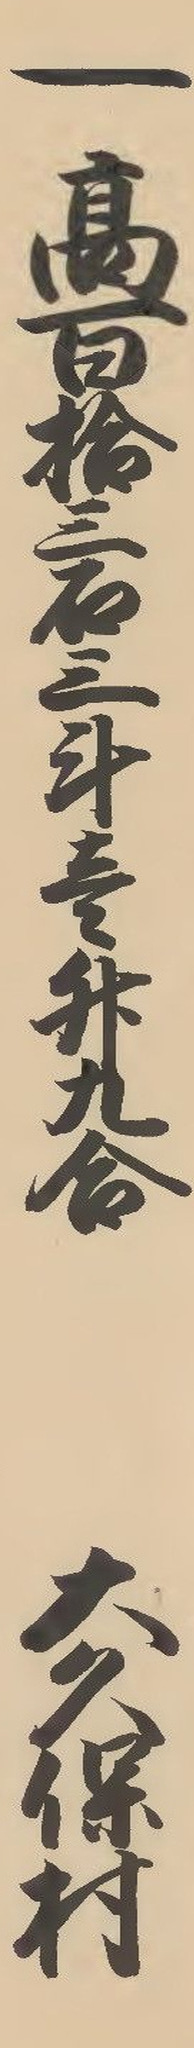一高百拾三石三斗壱升九合大久保村
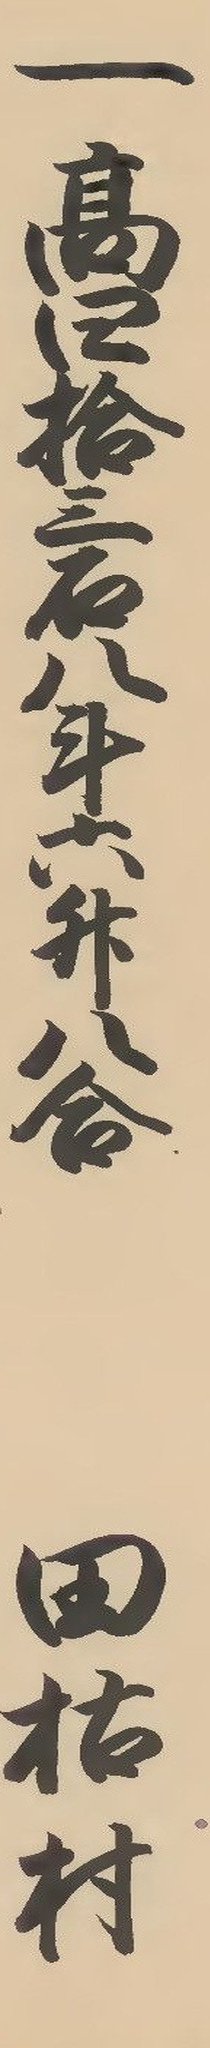一高四拾三石八斗六升八合田枯村
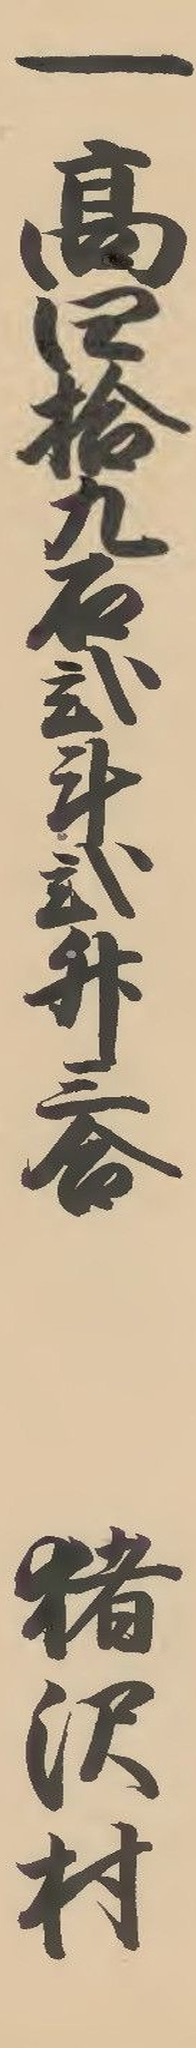一高四拾九石弐斗弐升三合猪沢村

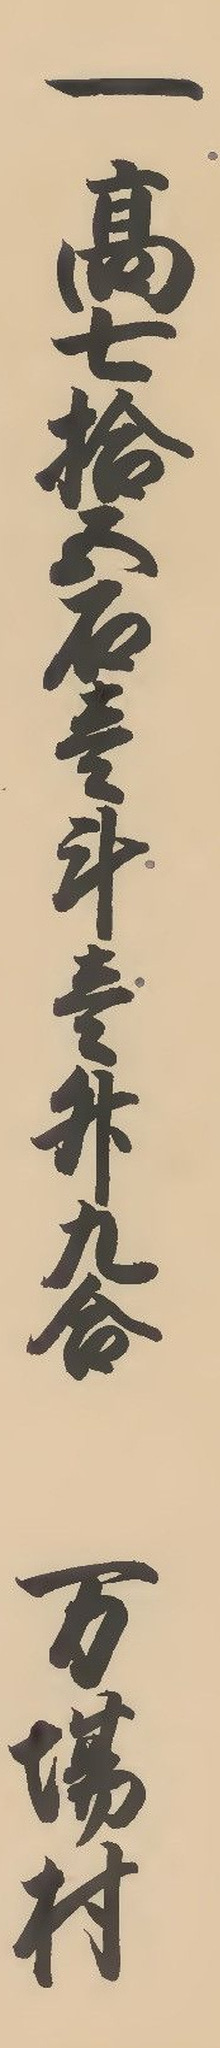一高七拾五石壱斗壱升九合万場村
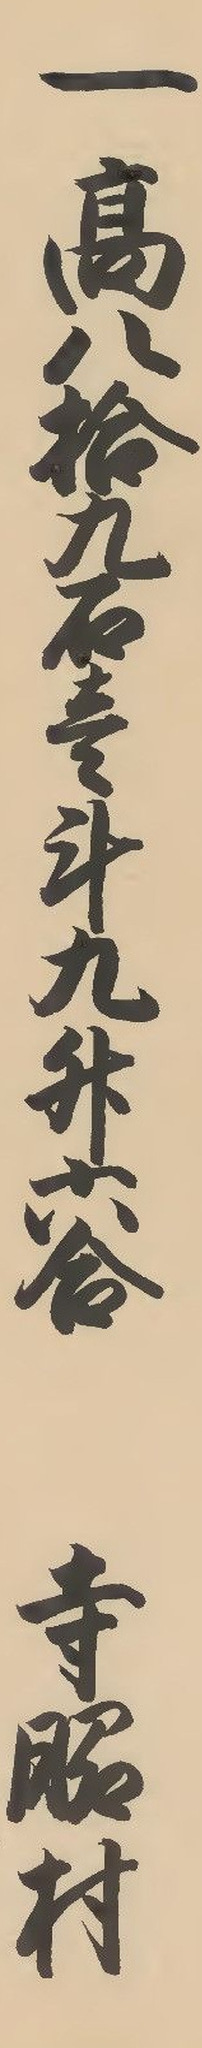一高八拾九石壱斗九升六合寺脇村
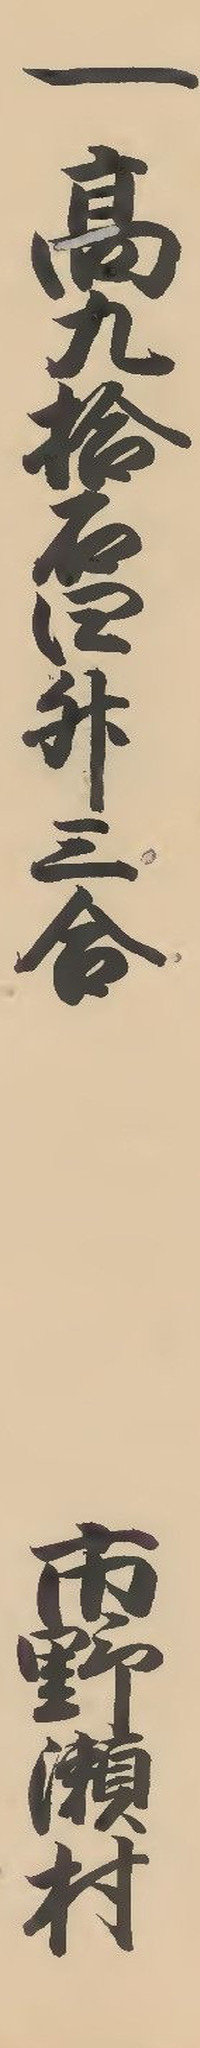一高九拾石四升三合市野瀬村
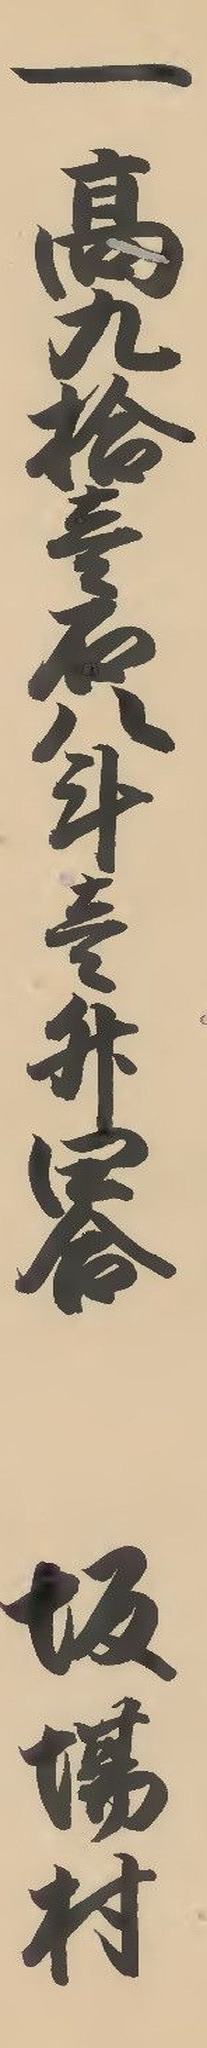一高九拾壱石八斗壱升四合坂場村
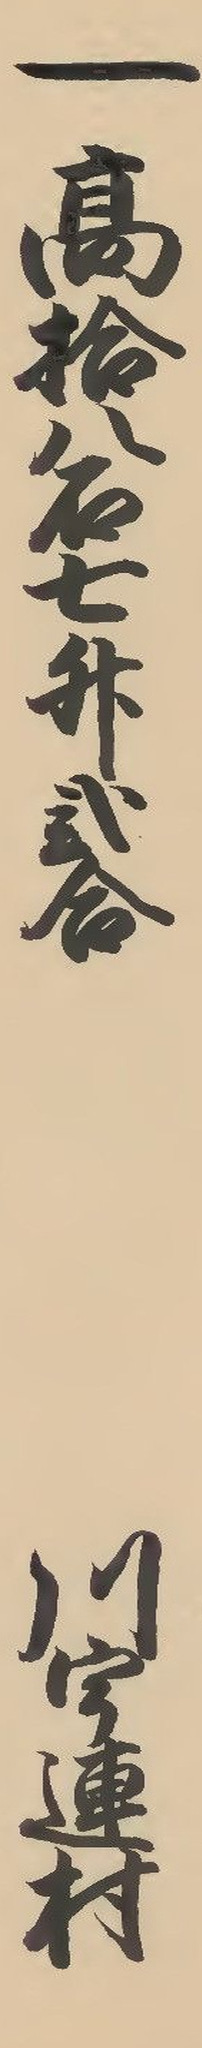一高拾八石七升弐合川宇連村
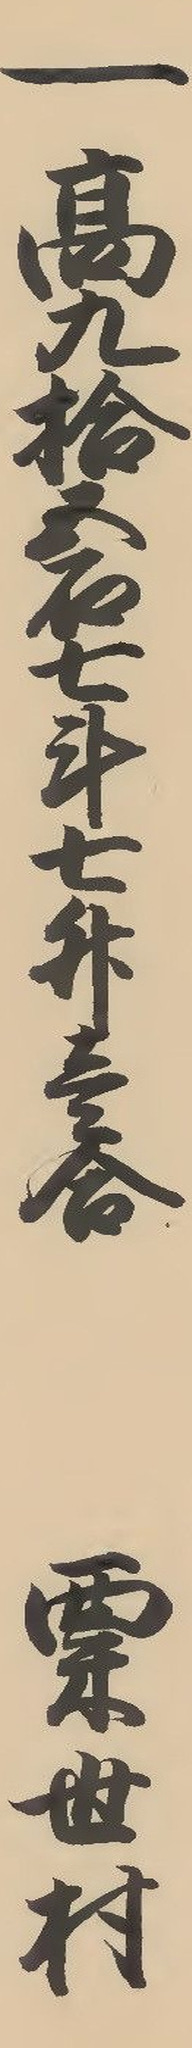一高九拾五石七斗七升壱合粟世村
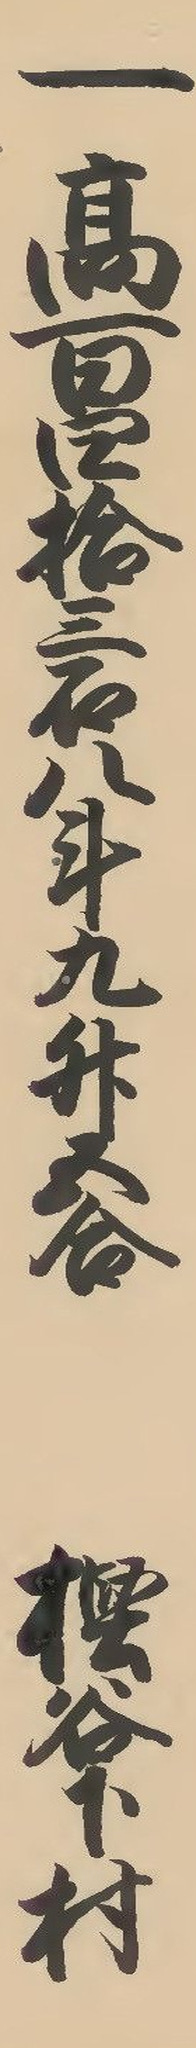一高百四拾三石八斗九升五合樫谷下村

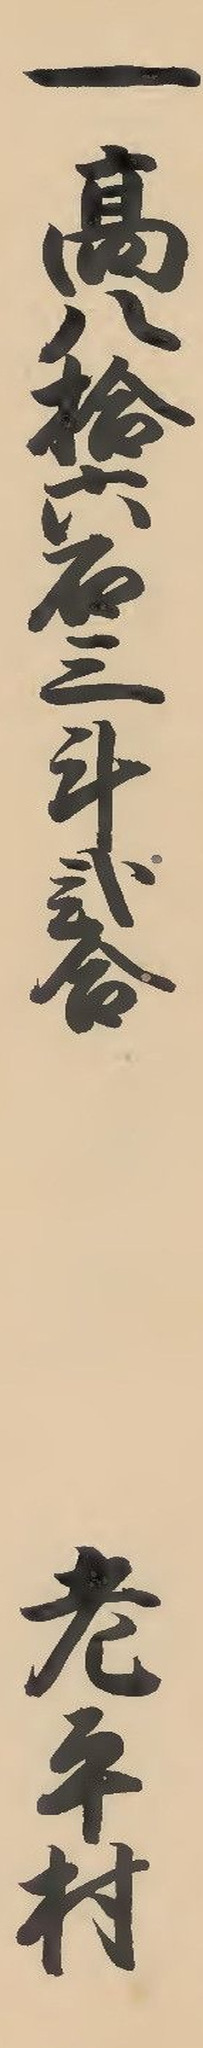一高八拾六石三斗弐合老平村
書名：三河国郷帳
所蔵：国立公文書館 National Archives of Japan
